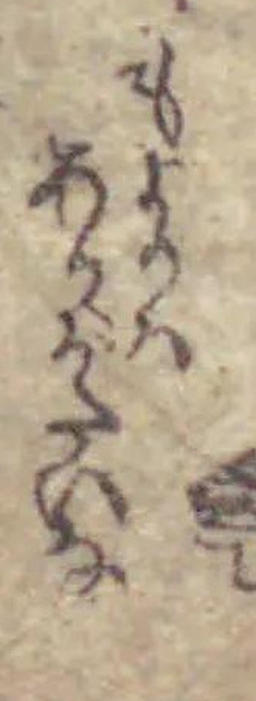ありがたいな
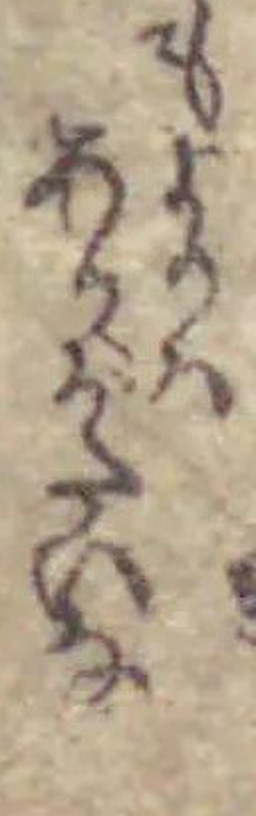ありがたいな
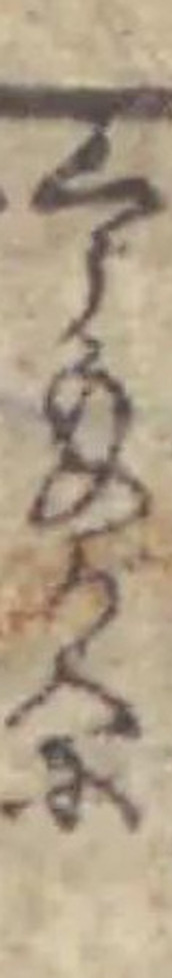くうものが人に
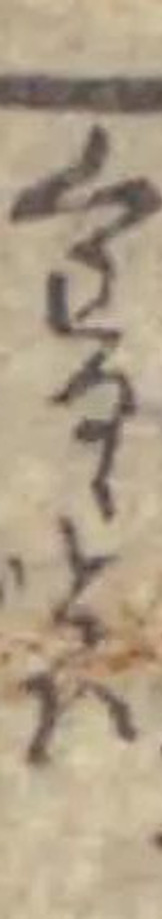くわるゝとは
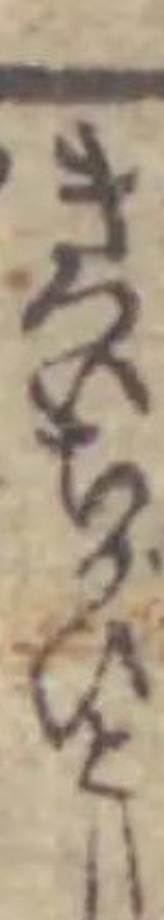きついちがひと
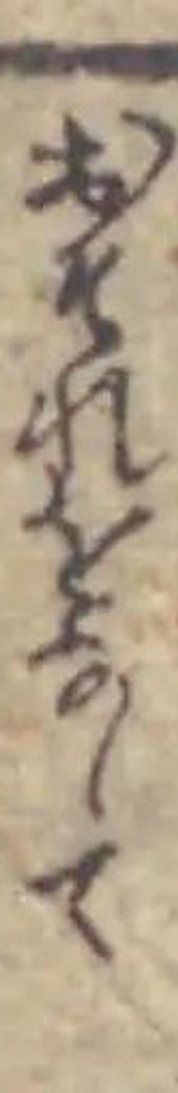おそれをなして
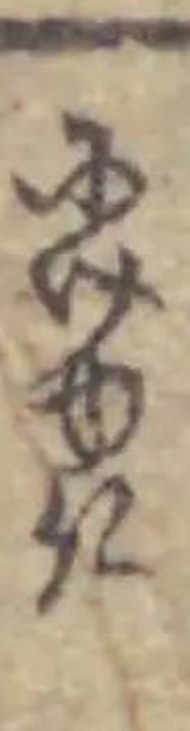ふけゆき
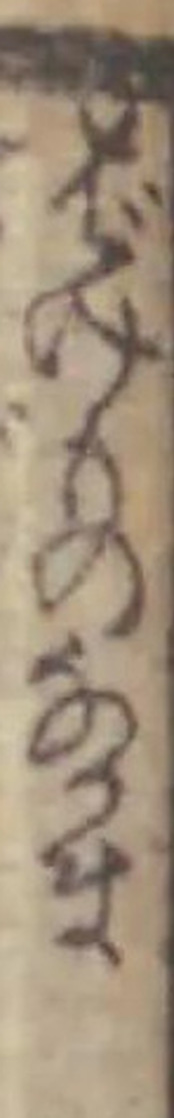ばけものなかま
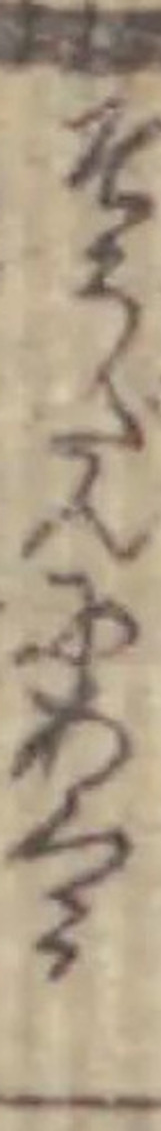そうだんにあくみ
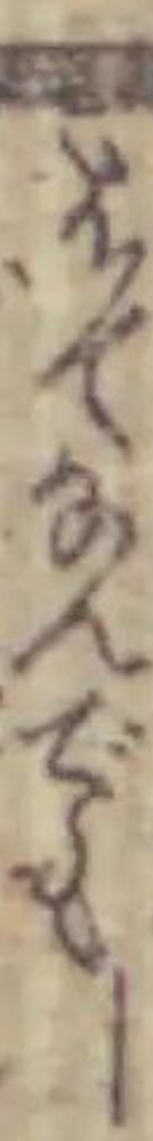はてなんでも
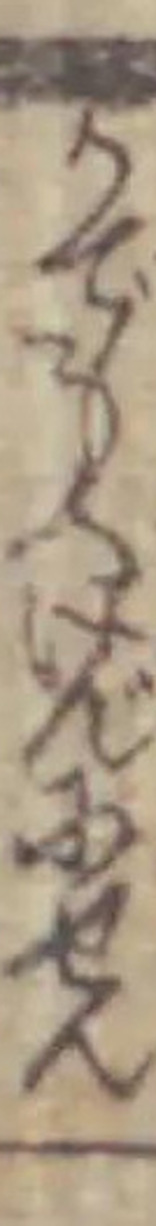かでも人げんにせん
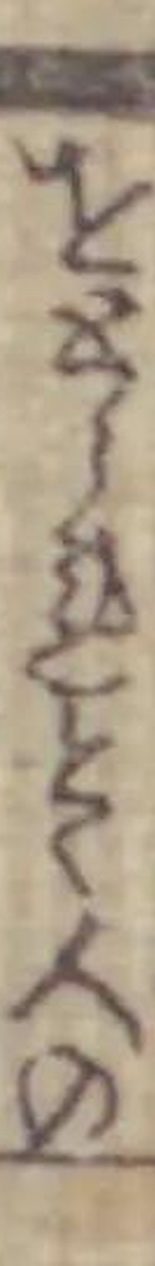をとられとく人の
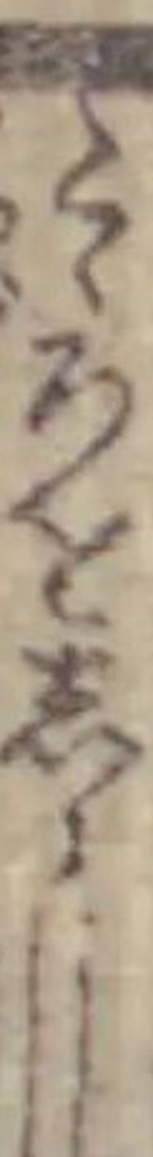こゝろをしら
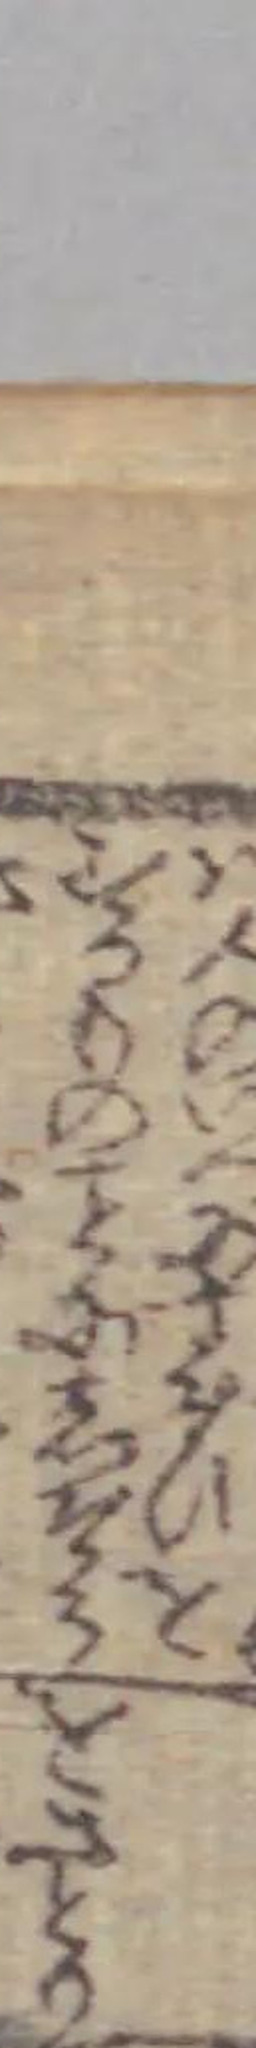するものことにしそうをさとり
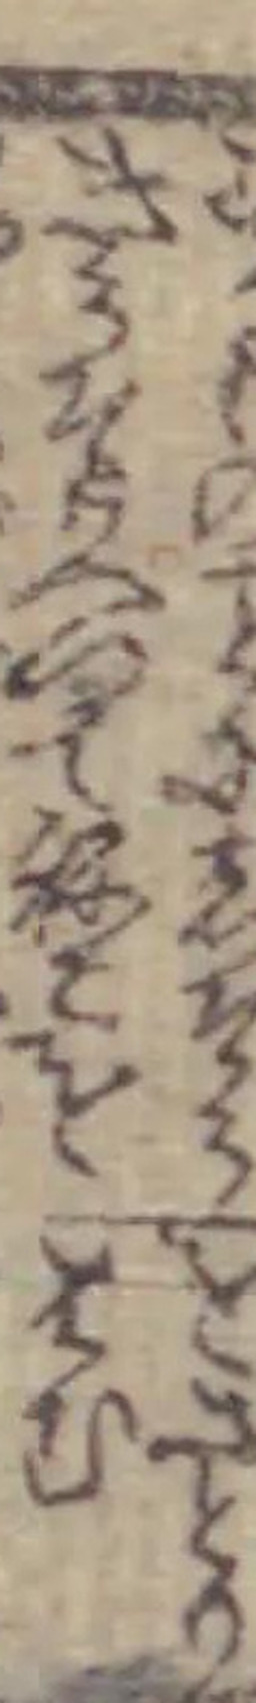きうそかへつてねこをはむ
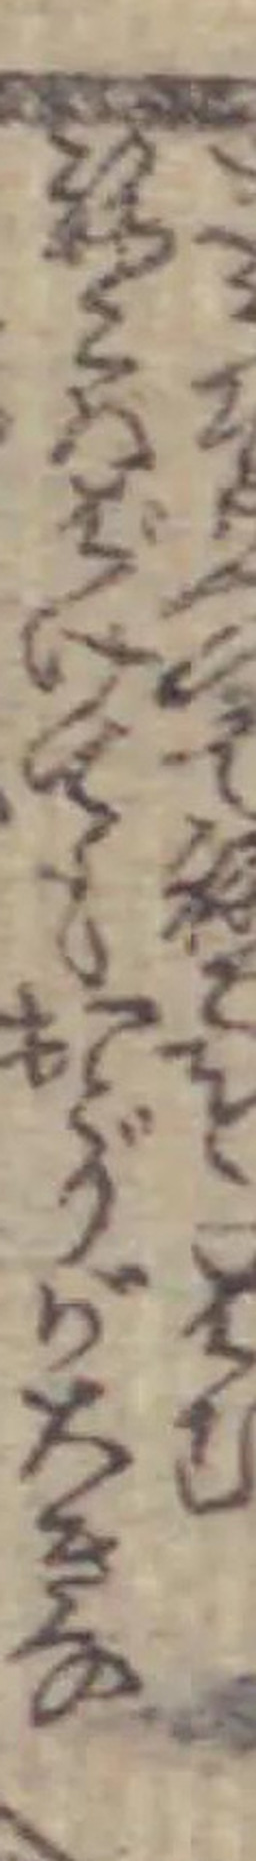ねこはばけてもおどりが大きな
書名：化物昼寝鼾 2巻
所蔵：国立国会図書館 National Diet Library, JAPAN
